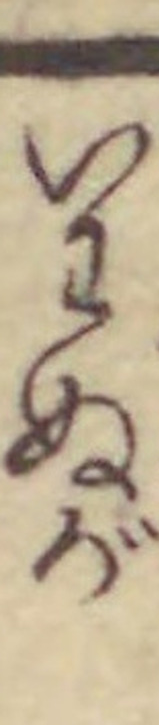いわぬが
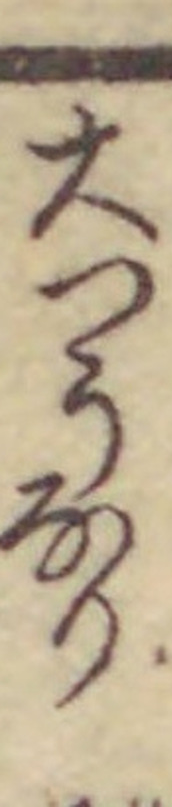大つうなり
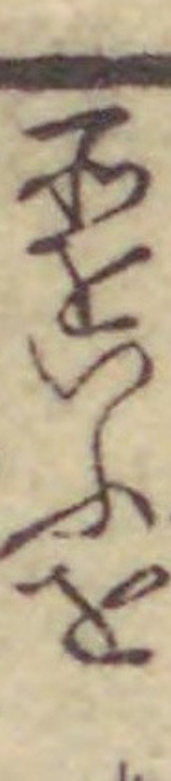所をいふを
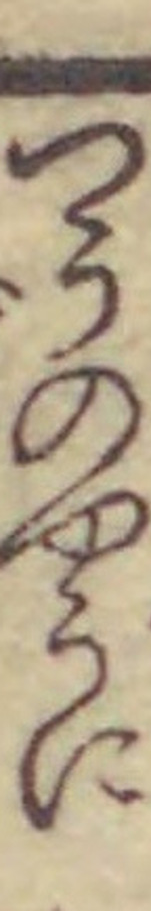つうのやうに
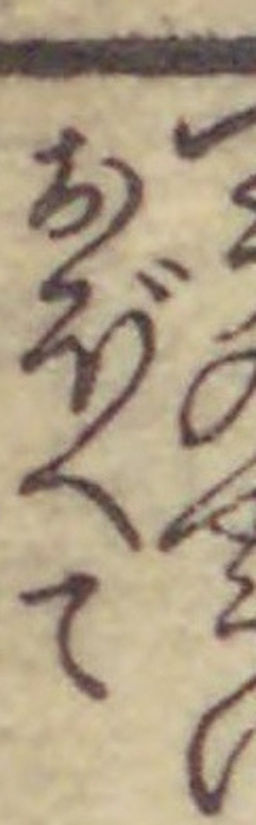おぼへて
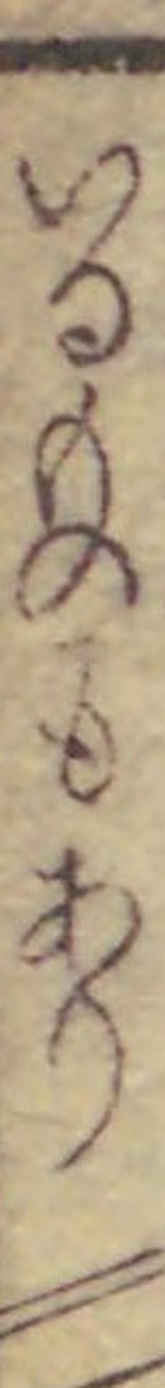いるものもあり

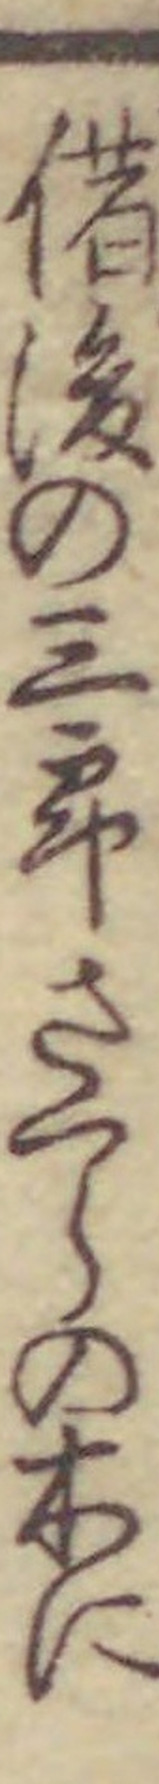備後の三郎さくらの木に
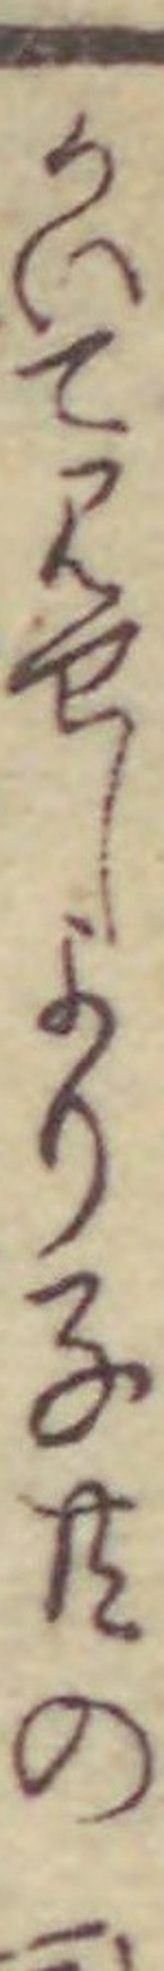かいて見せしより子共の
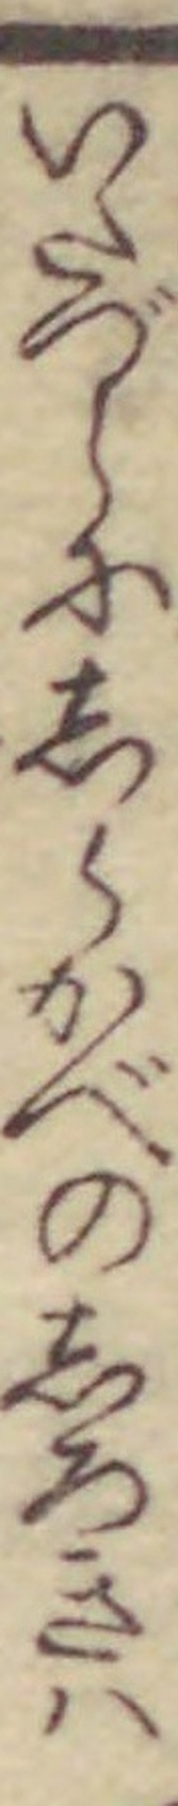いたづらにしらかべのしろきは
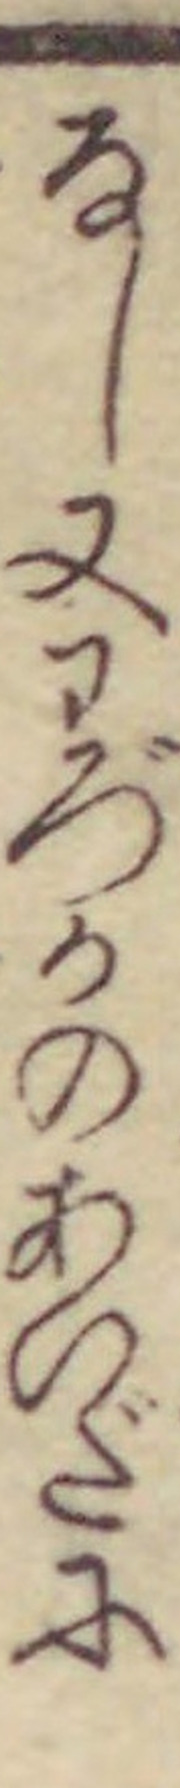なし又わづかのあいだに
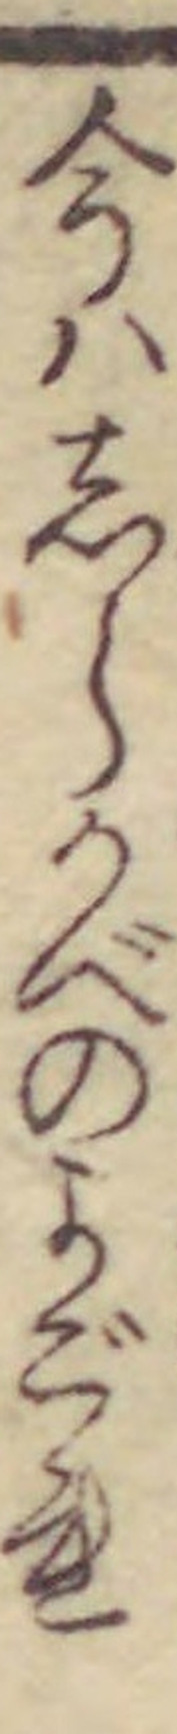今はしらかべのよごれ
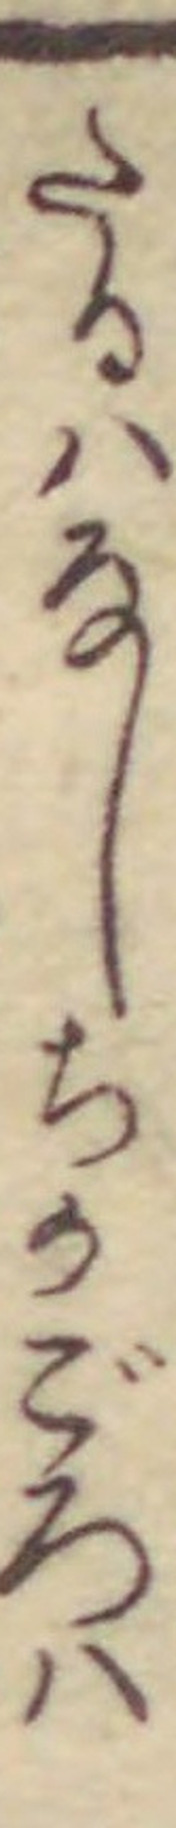たるはなしちかごろは
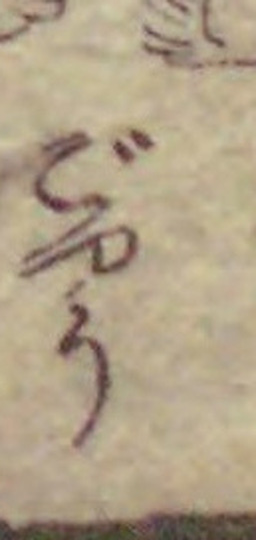ごやう
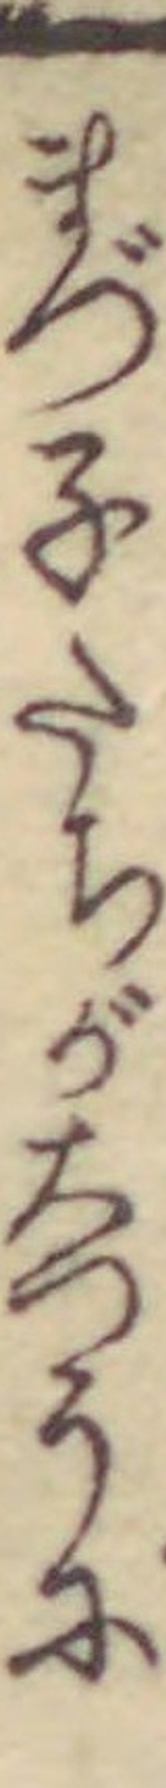まづ子たちが大つうに
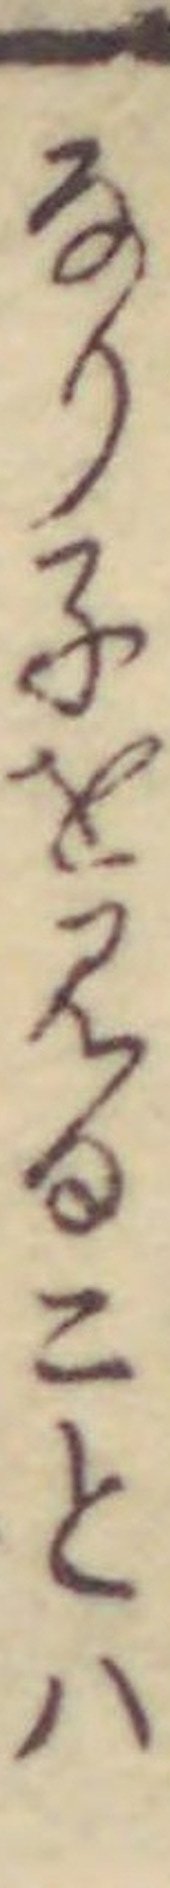なり子を見ることは
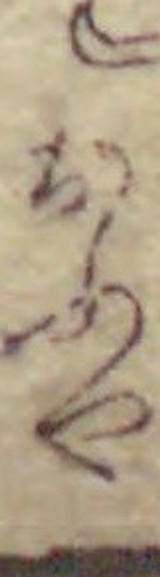おふや
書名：大通人穴[サガシ] 3巻
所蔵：国立国会図書館 National Diet Library, JAPAN
